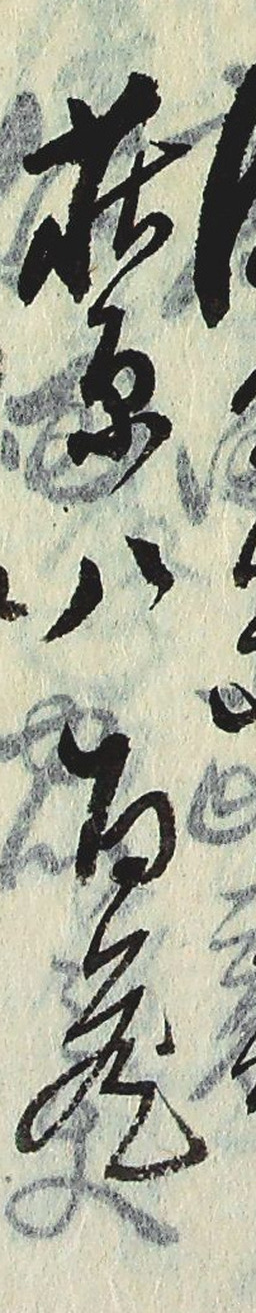萩原八百蔵
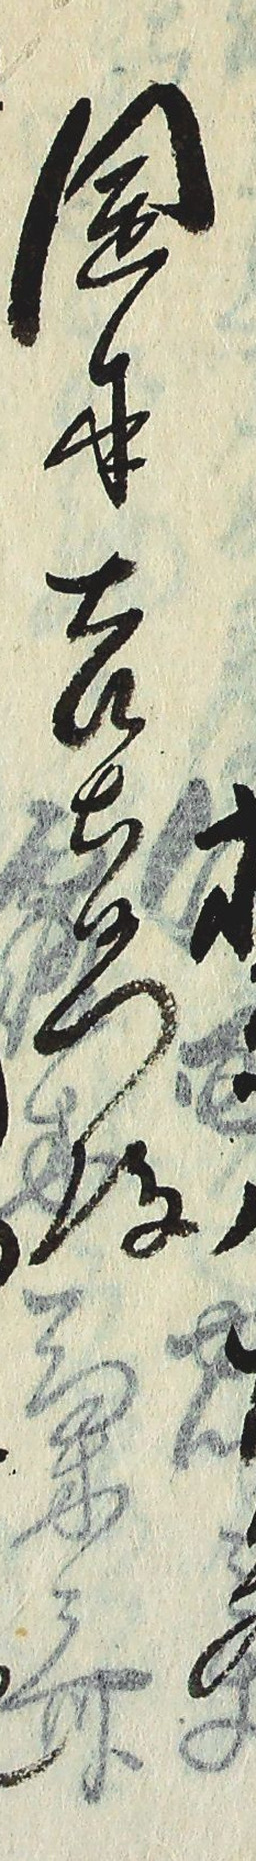岡本吉右衛門殿
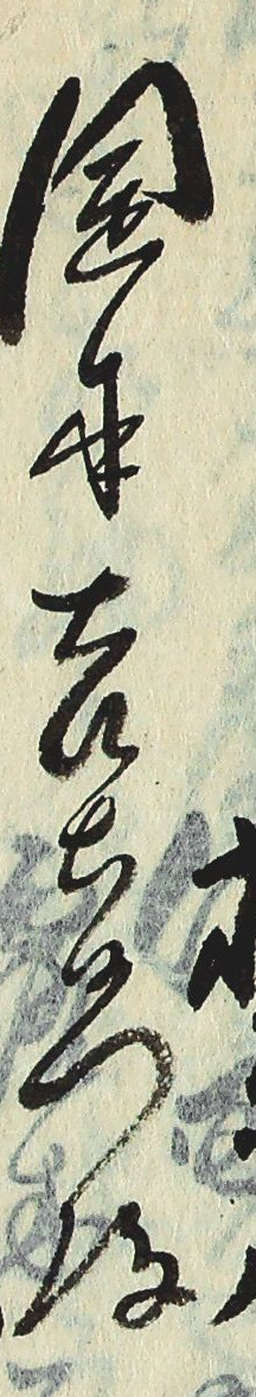岡本吉右衛門殿
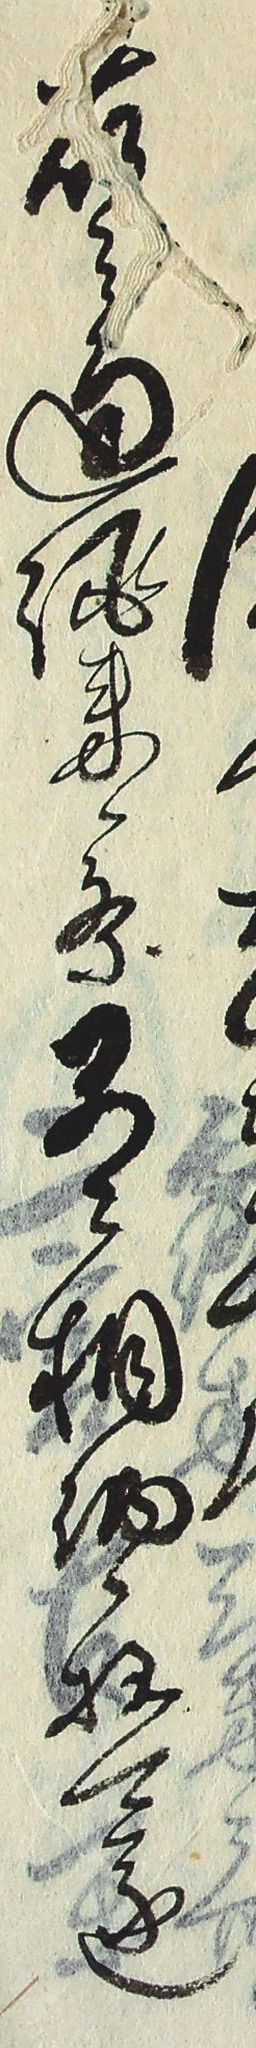右之通誂来候条早々相納候様可遂

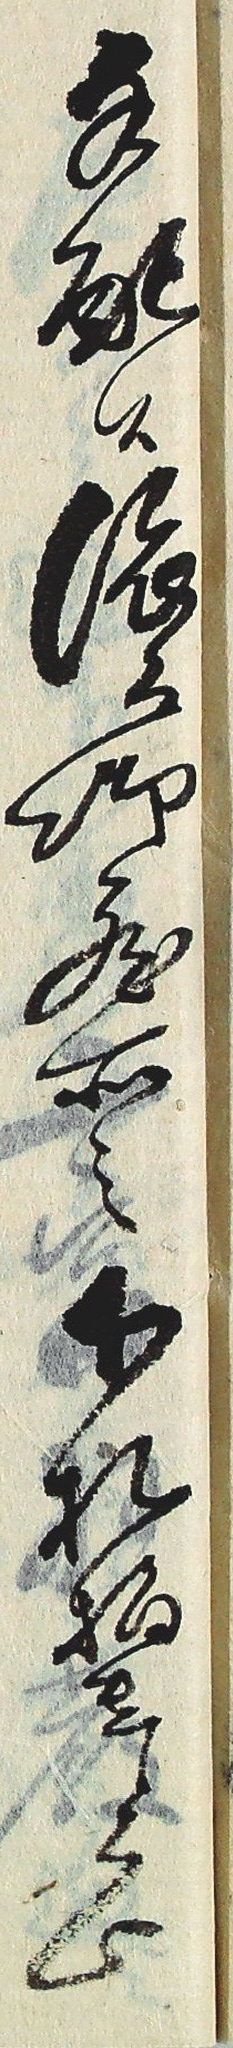手配候依て御蔵所之下札指遣し候以上
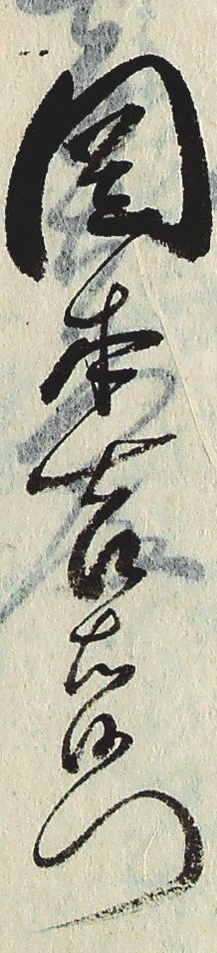岡本吉右衛門
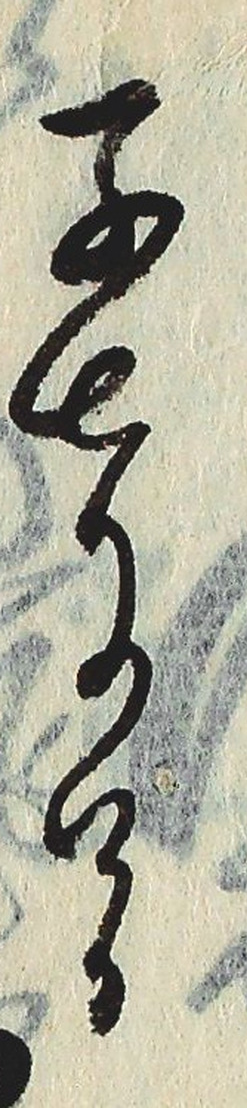子七月四日
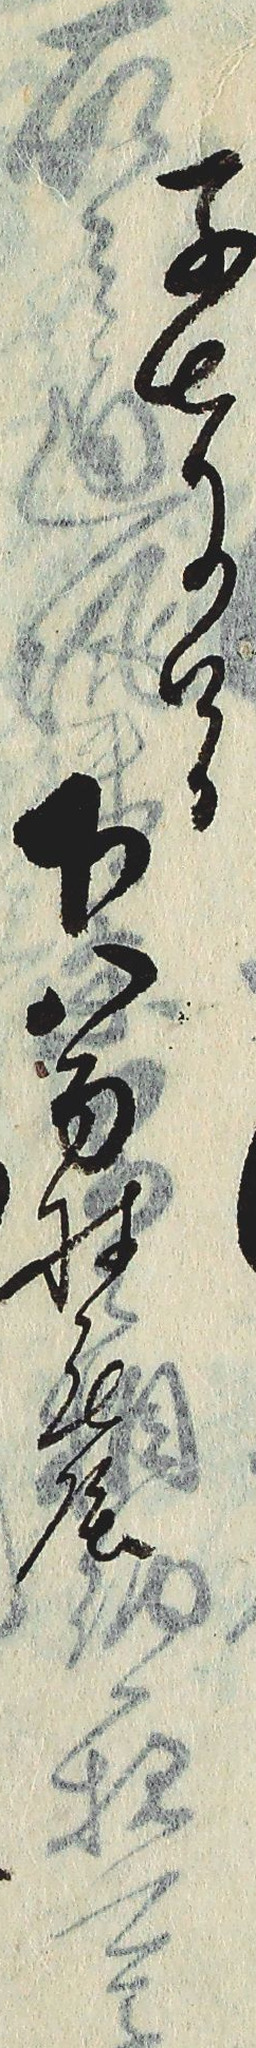下八万村庄屋
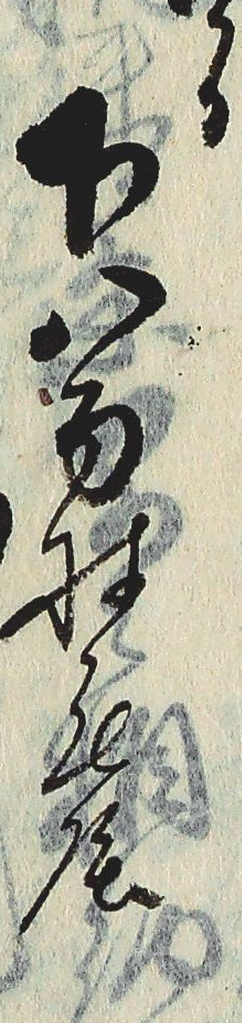下八万村庄屋
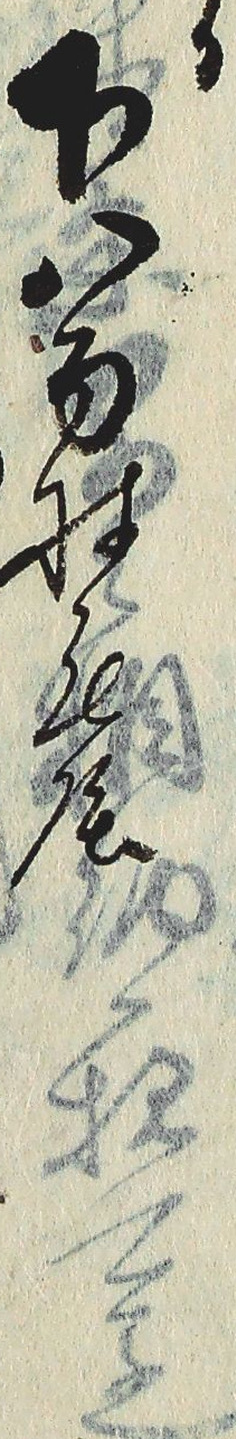下八万村庄屋
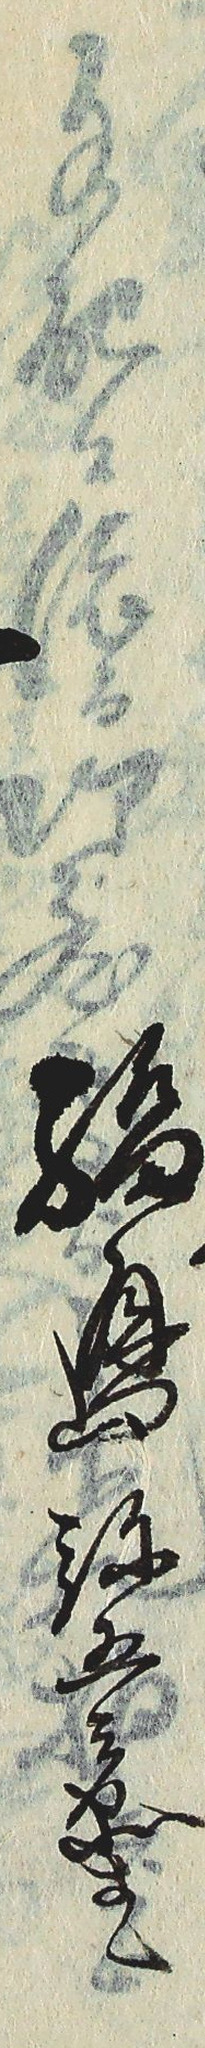福島弥五兵衛方へ
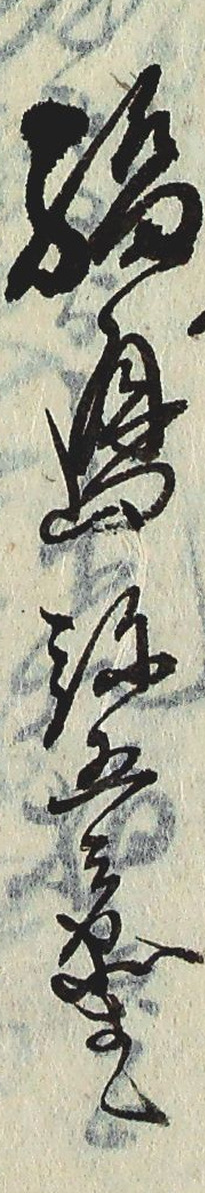福島弥五兵衛方へ
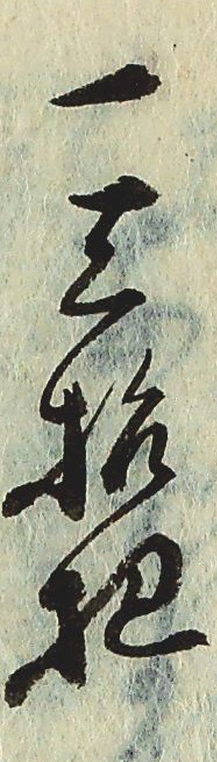一三拾把桧檀
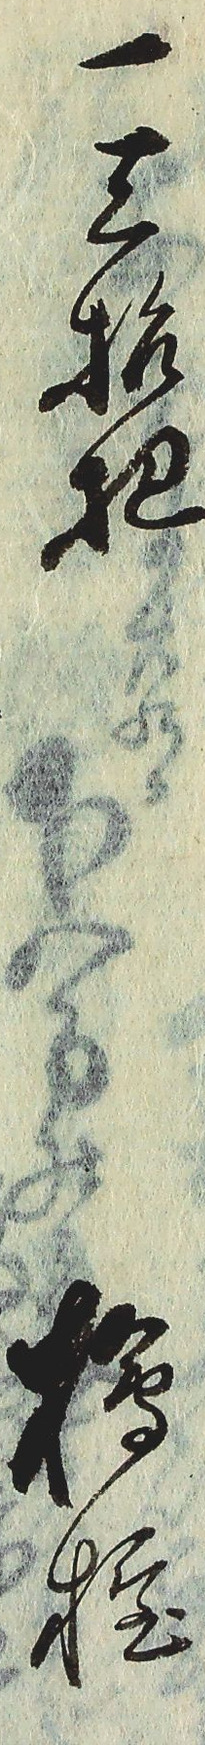一三拾把桧檀
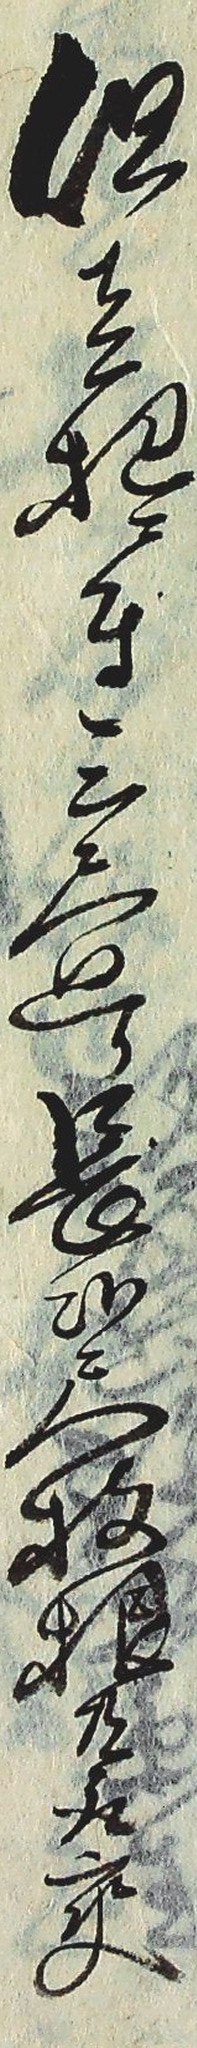但壱把に付三尺廻り長弐尺枝根共取交
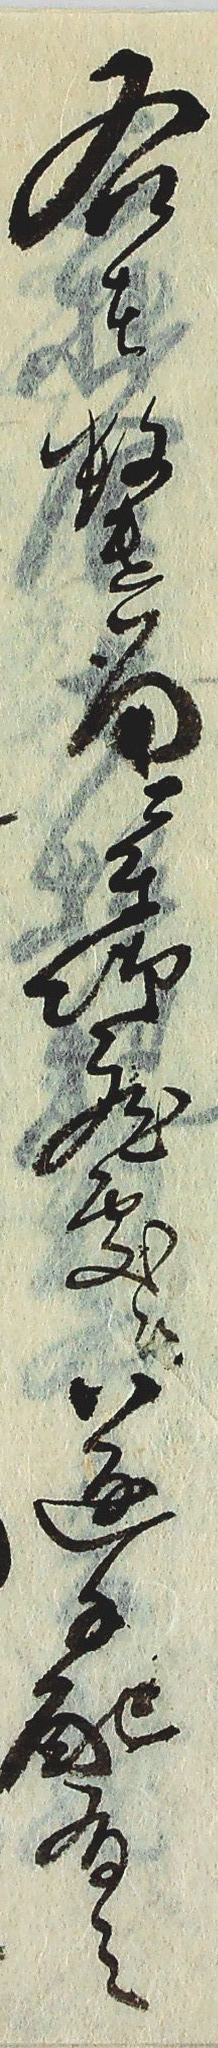右は蚊遣御用に付御蔵処え遂手配有之
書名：名東郡中諸割賦元帳
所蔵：鳴門教育大学 Naruto University of Education
